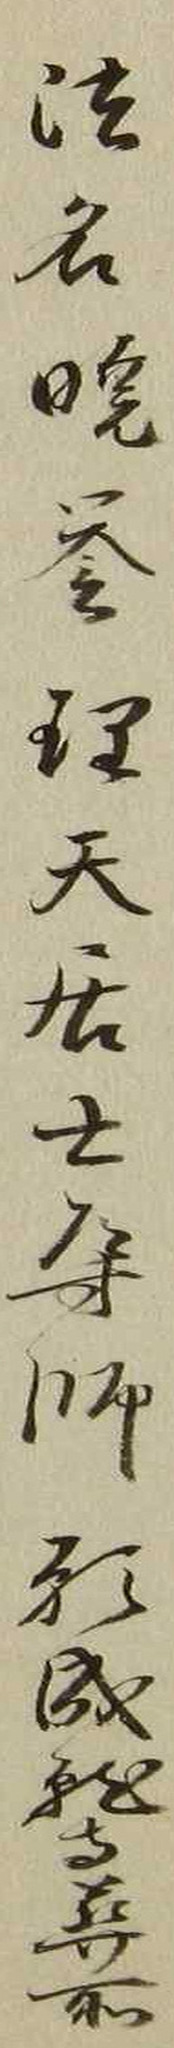法名暁誉理天居士導師願成就寺葬所
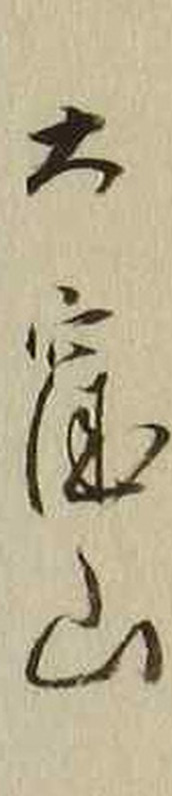大窪山
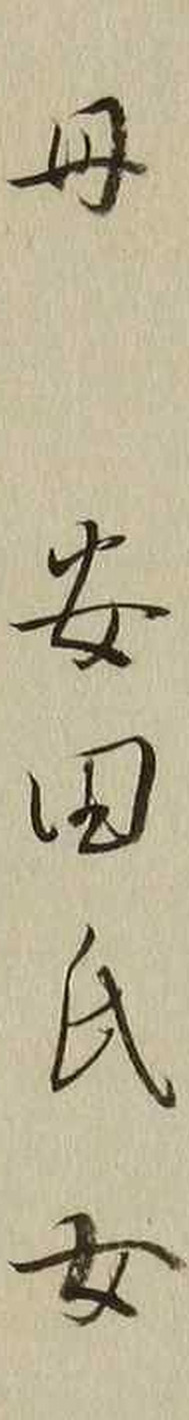母安田氏女
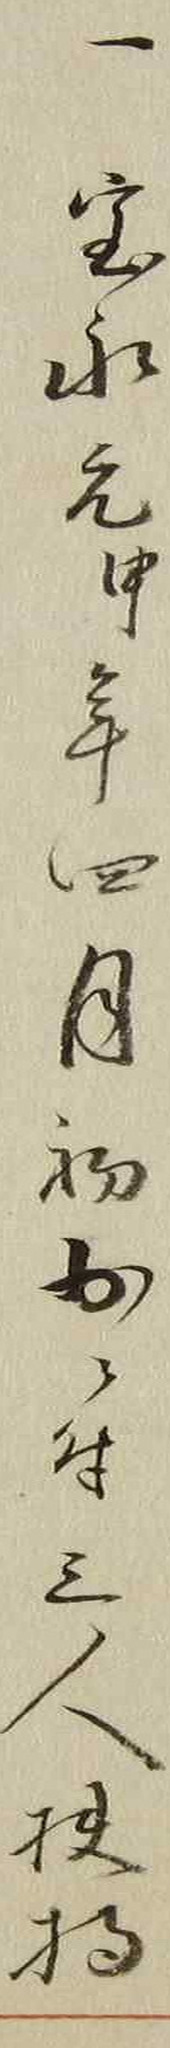一宝永元申年四月初出ニ付三人扶持
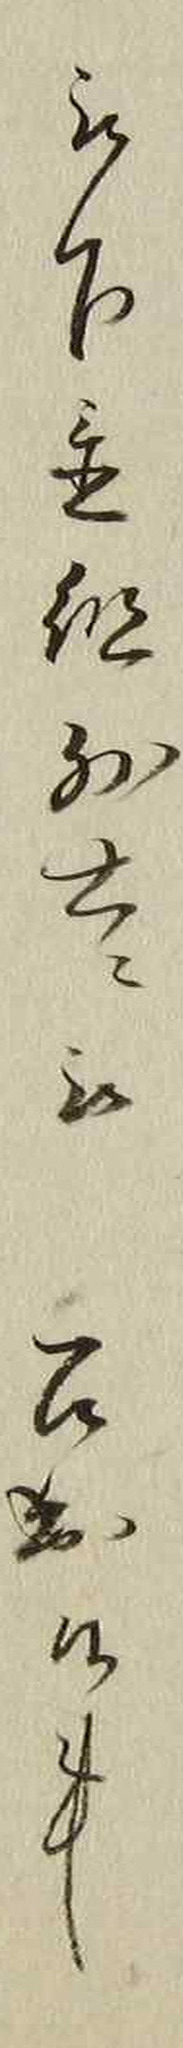被下置組外士ニ被召出候事
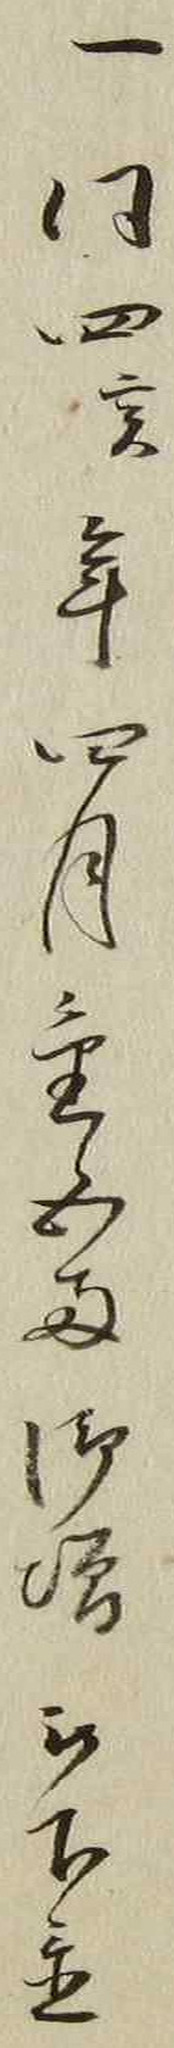一同四亥年四月金五両御増被下置
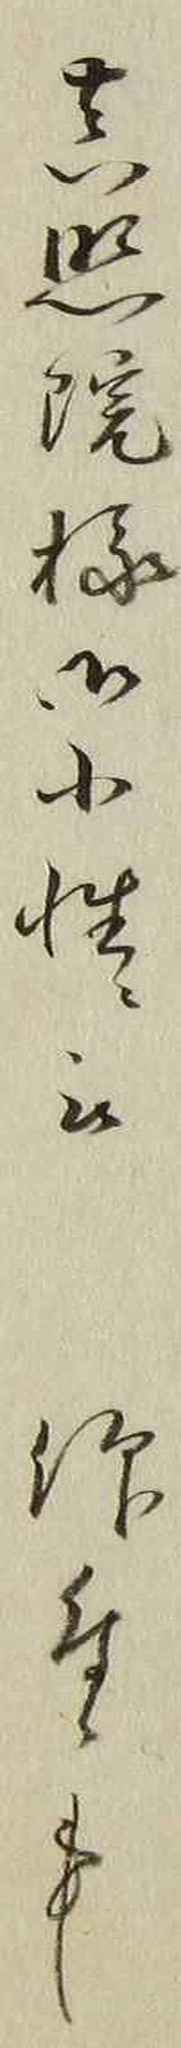真照院様御小性ニ被仰付候事
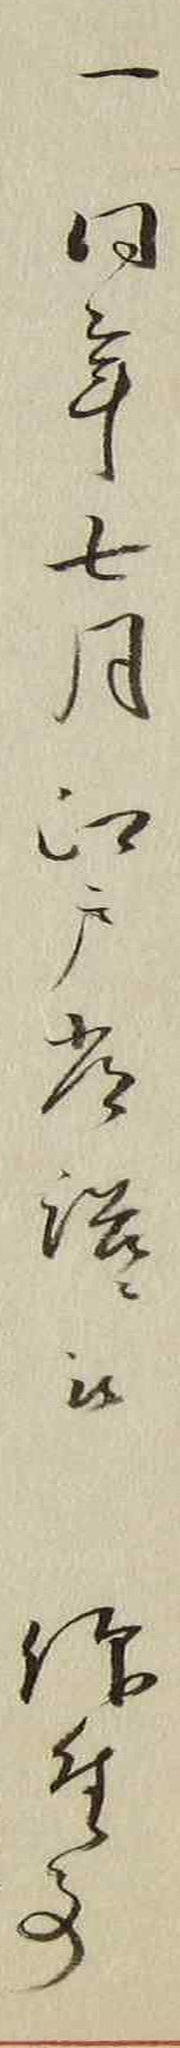一同年七月江戸常詰ニ被仰付候事
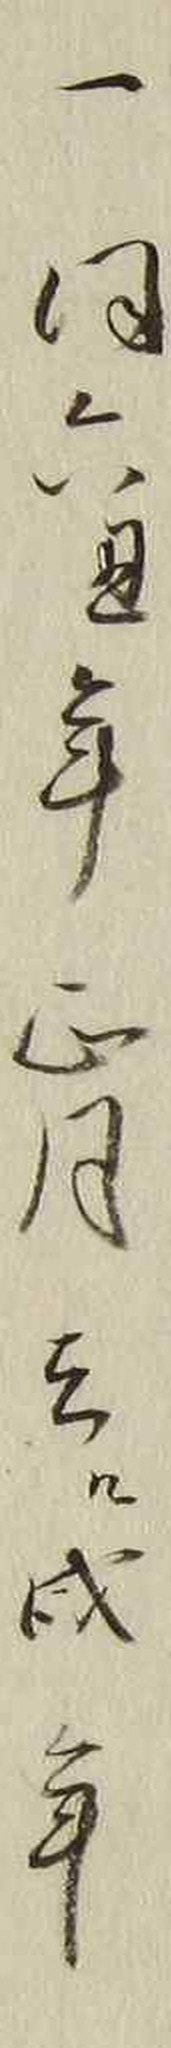一同六丑年正月去ル戌年
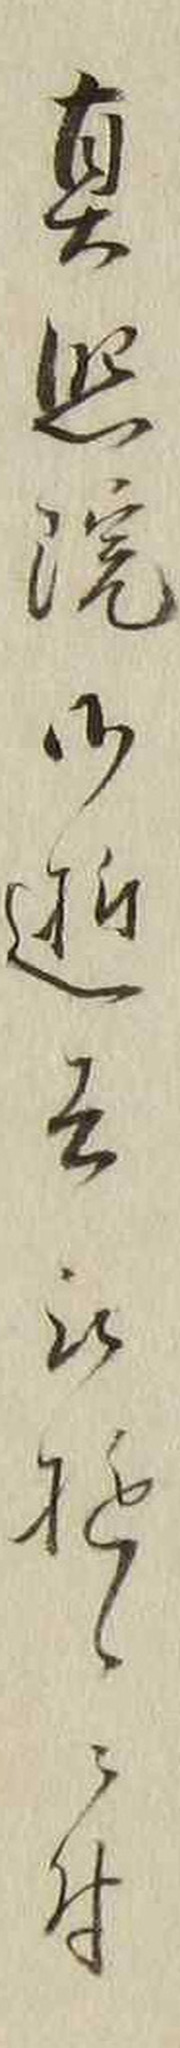真照院御逝去被遊候ニ付
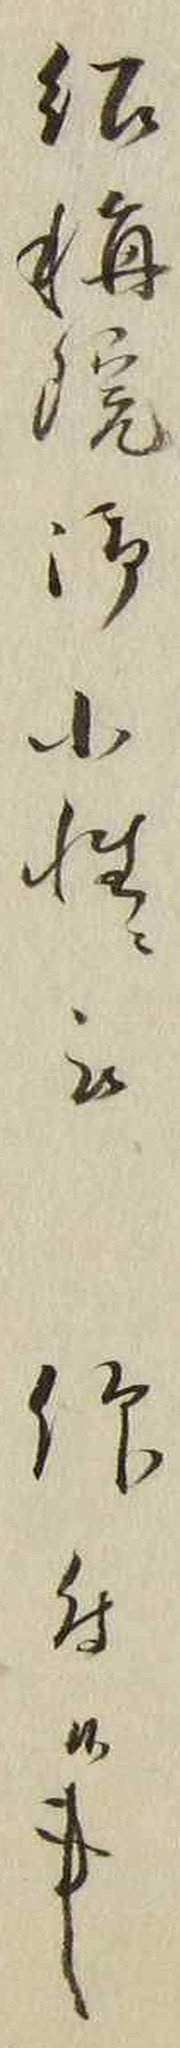紹栴院御小性ニ被仰付候事

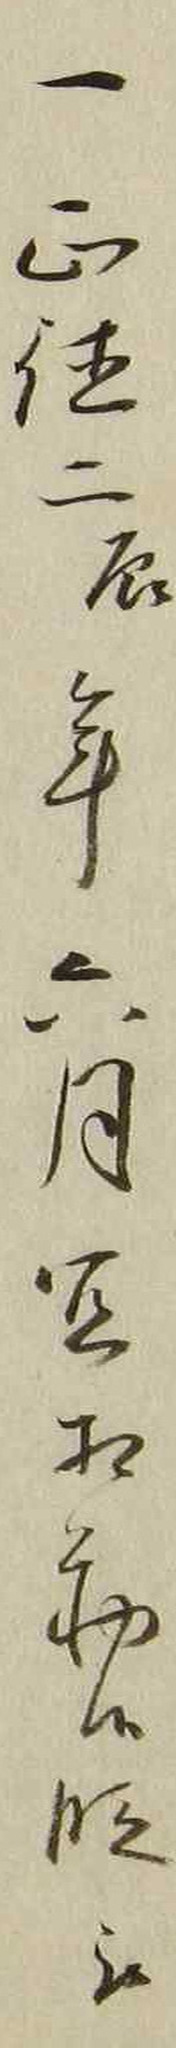一正徳二辰年六月宜相勤候段被
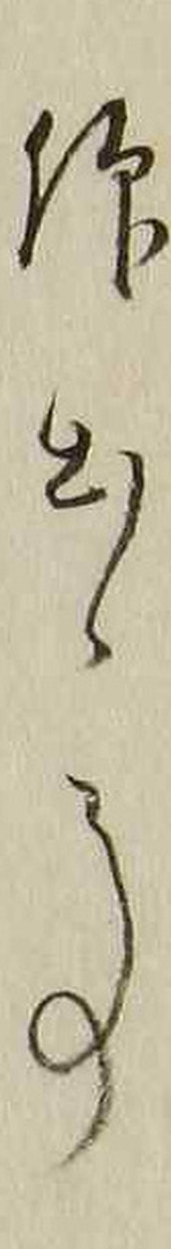仰出候事
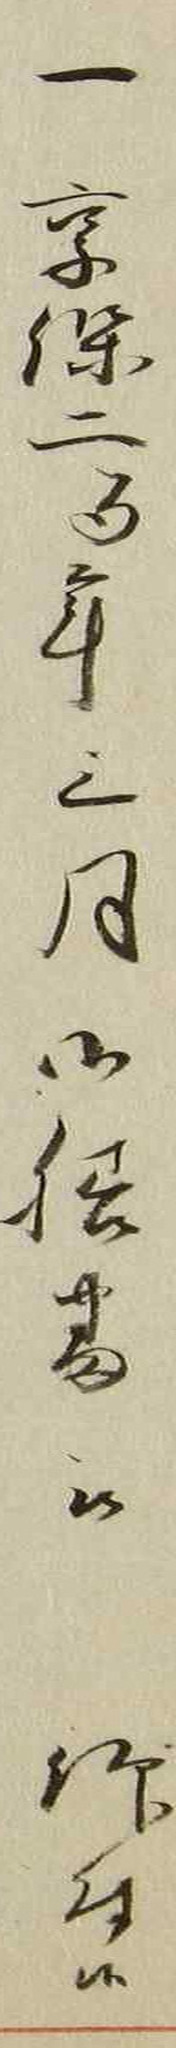一享保二酉年三月御張番被仰付候
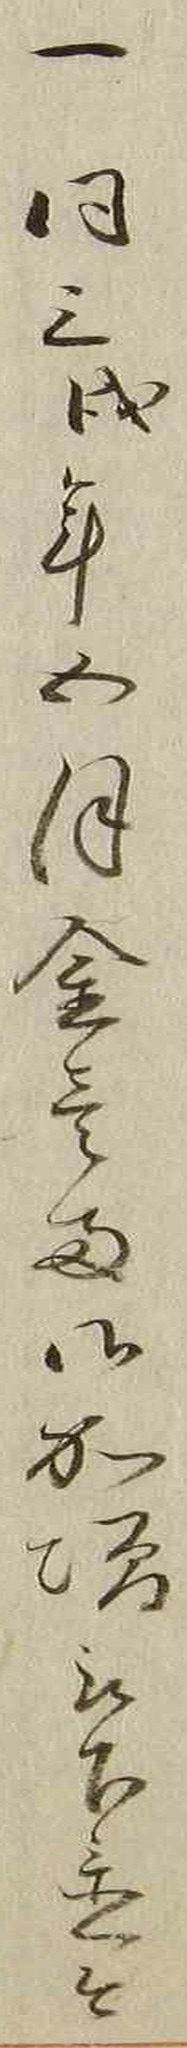一同三戌年五月金壱両御加増被下置今
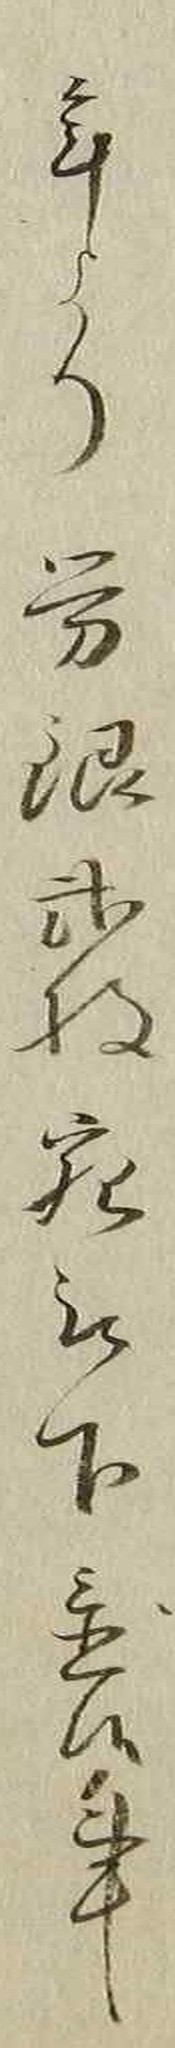年より労銀弐枚宛被下置候事
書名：諸士系譜　巻之32　い之部32
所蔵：会津若松市立会津図書館
